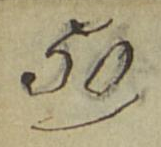50
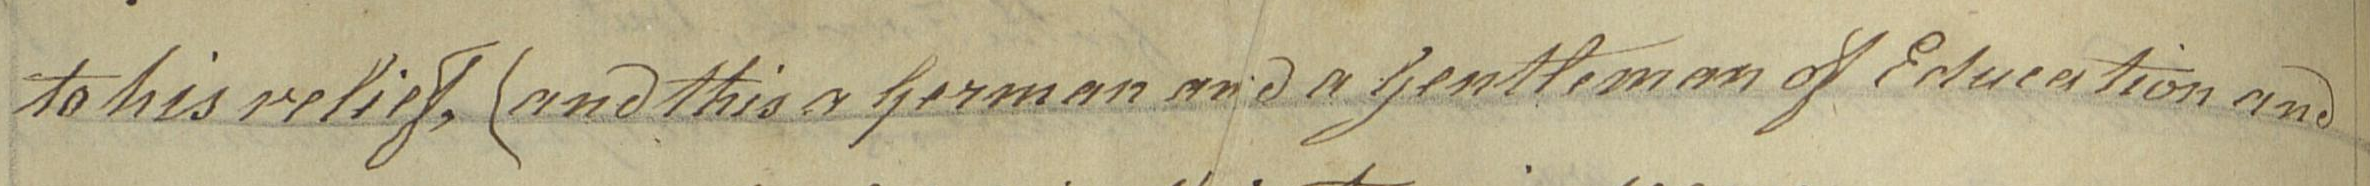to his relief, (and this a German and a Gentleman of Education and
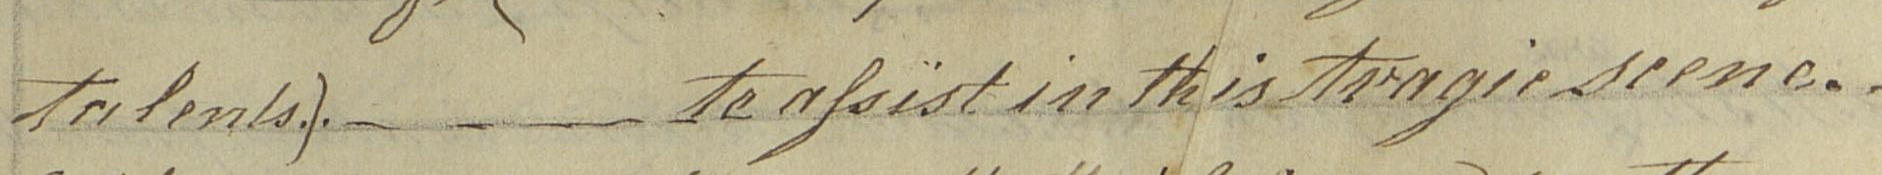Talents.) to assist in this tragic scene.
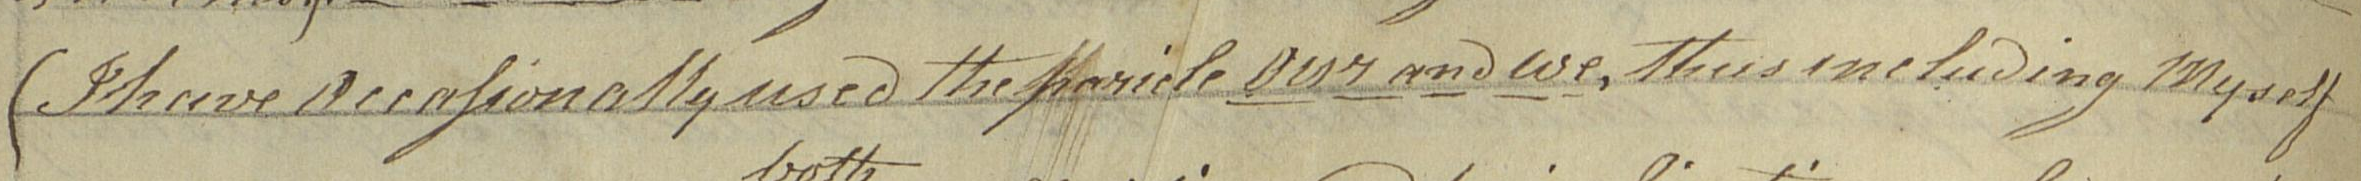(I have occasionally used the paricle our and we, thus including Myself
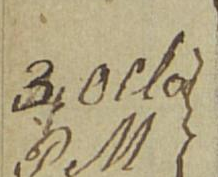3 OClo
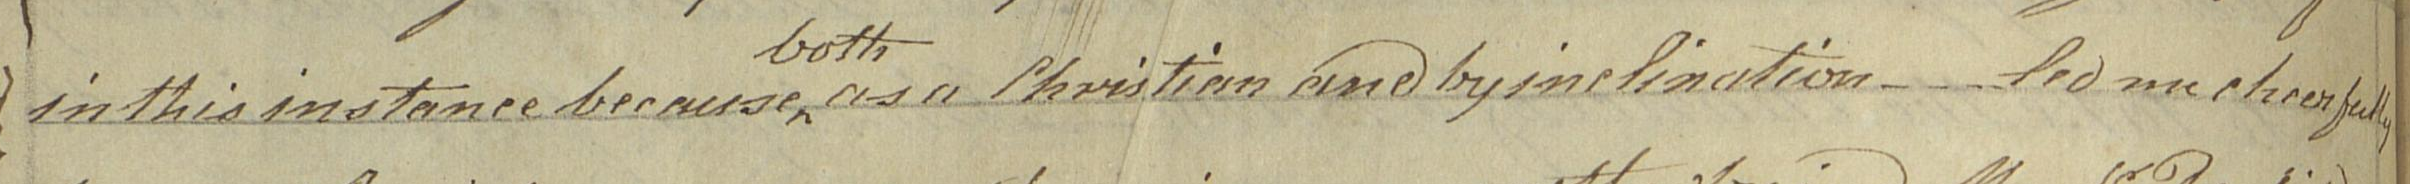in this instance because ^ as a Christian and by inclination led me cheerfully
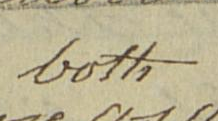both
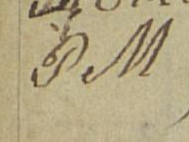PM
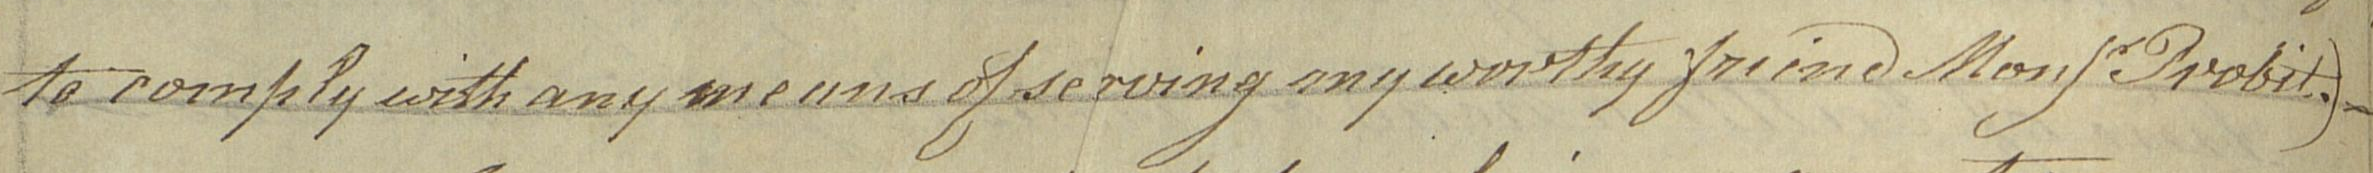to comply with any means of serving any worthy friend Mons^r Probit.)
